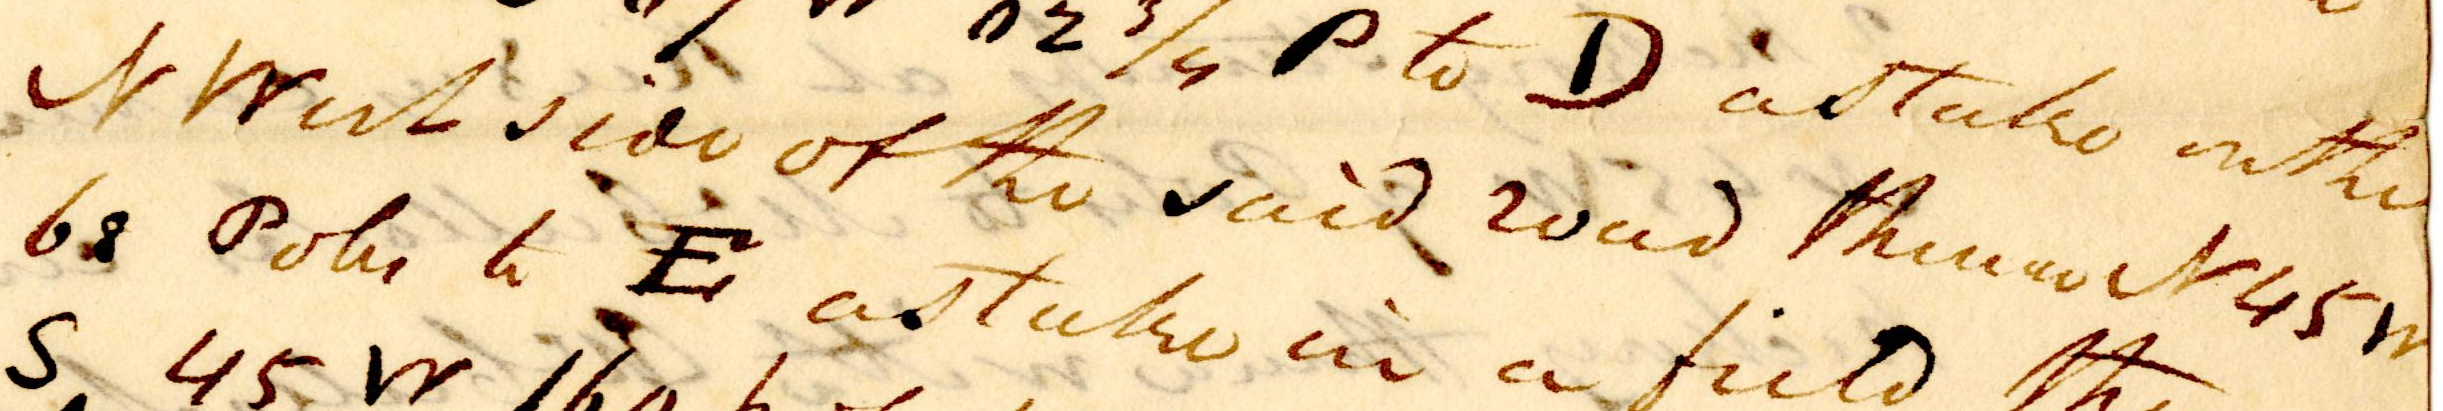N West side of the said road thence N45 W
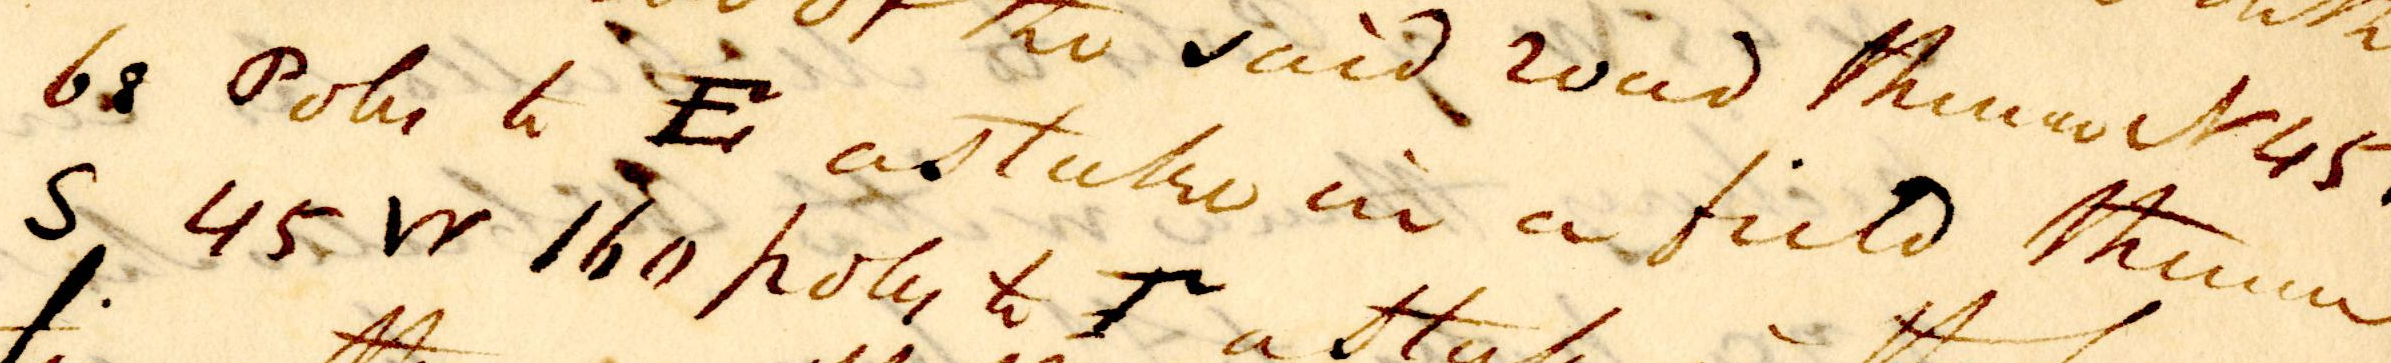68 Poles to E a stake in a field thence
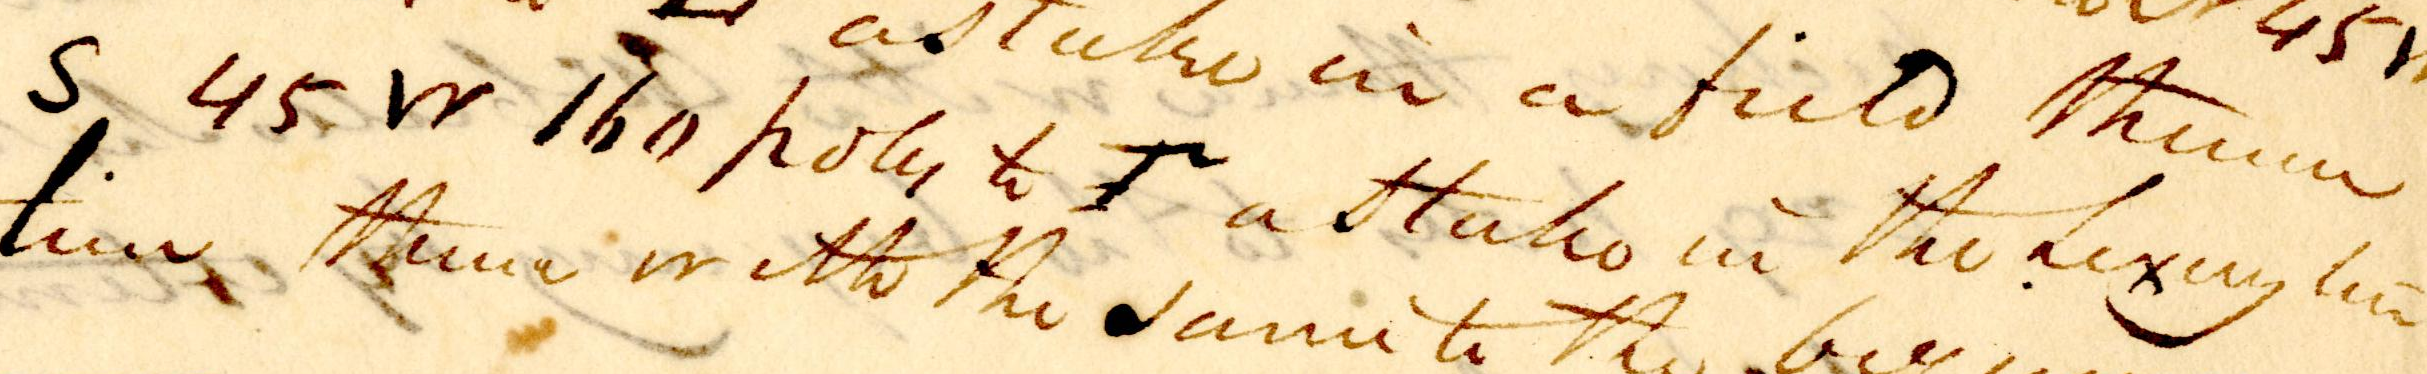S 45 W 160 Poles to F a stake in the Lexington
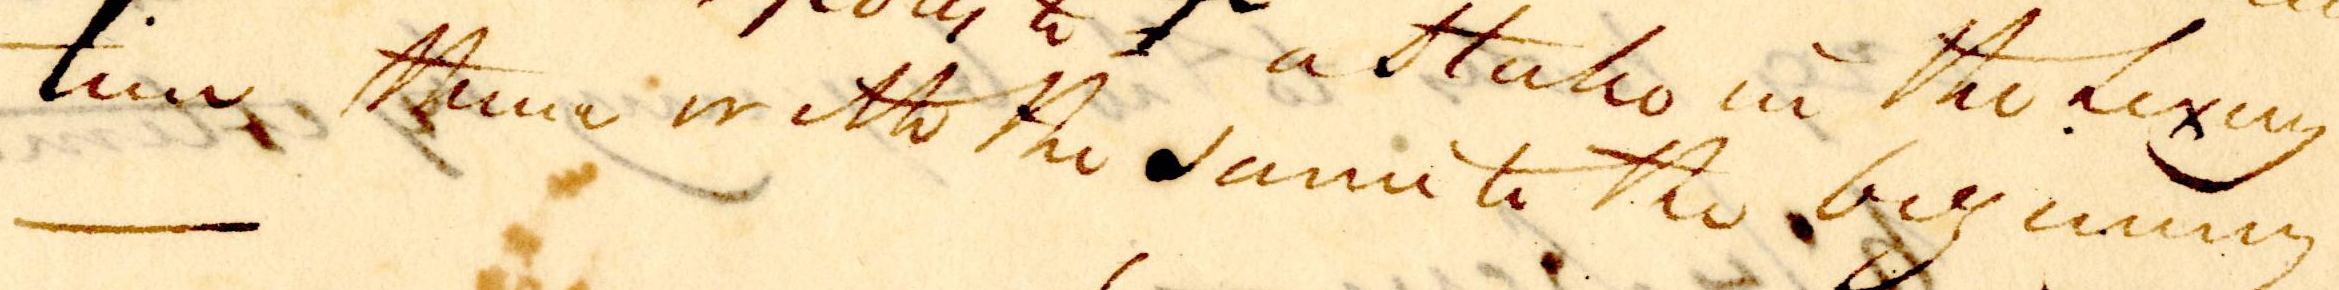line thence with the same to the beginning
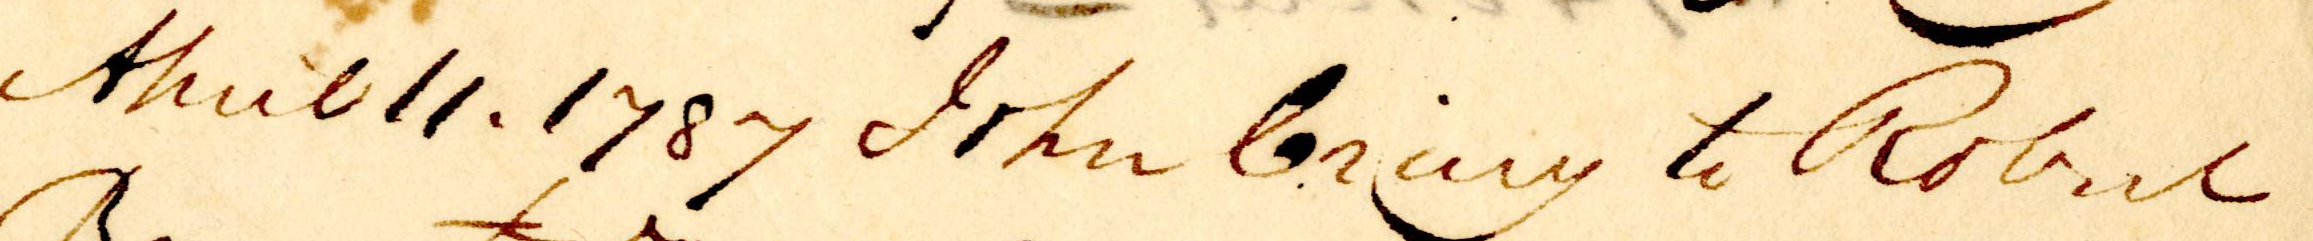April 11.1787 John Gray to Robert
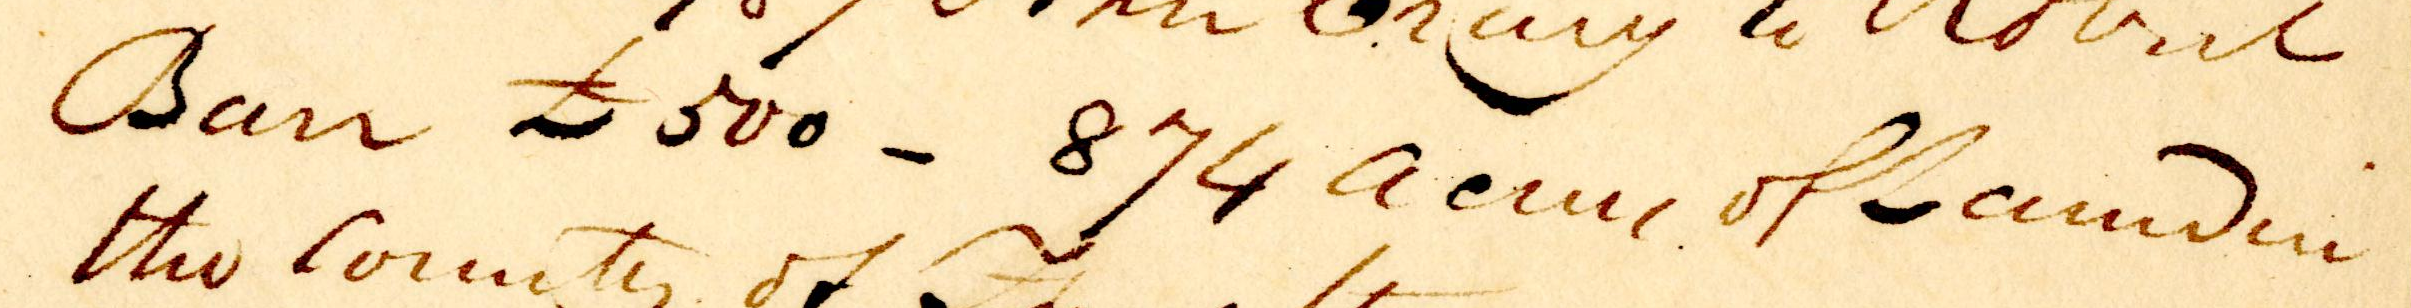Barn £ 500-874 acres of land in
